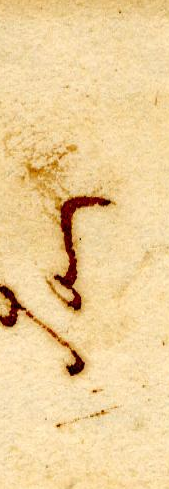To
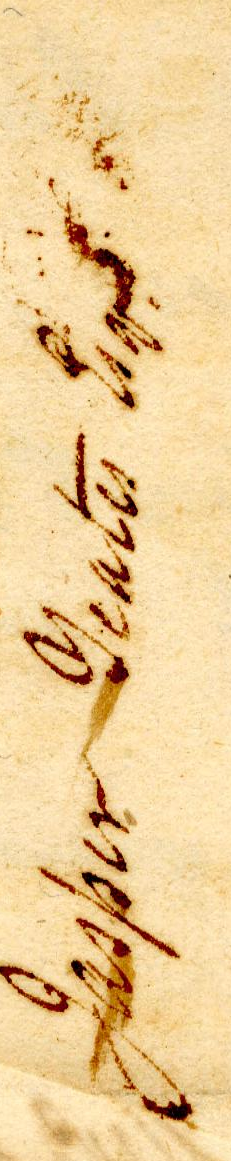Jasper Yeates Esq.
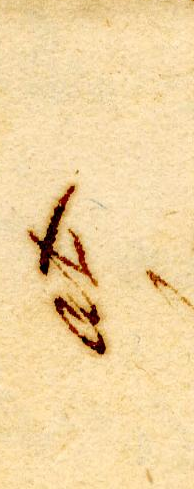at
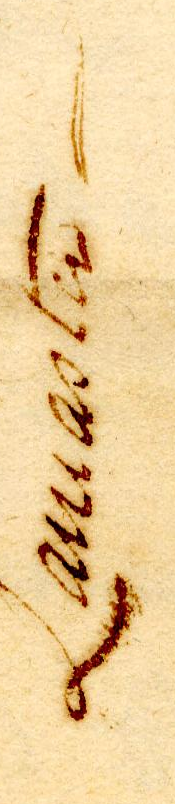Lancaster
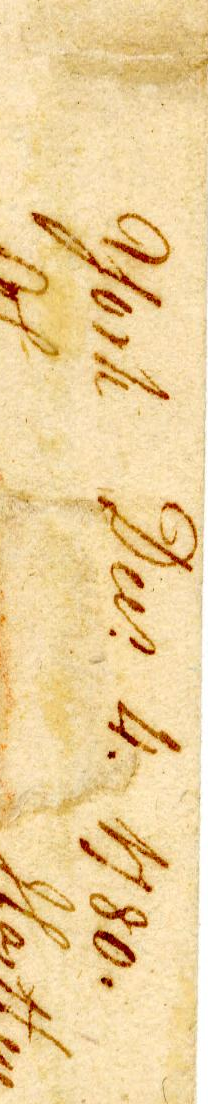York Dec^. 4. 1780
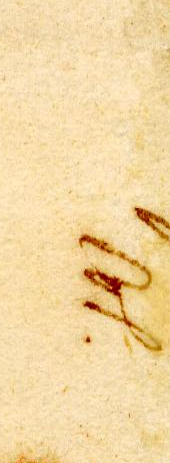At
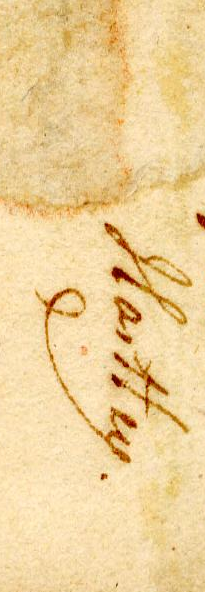Hartley
